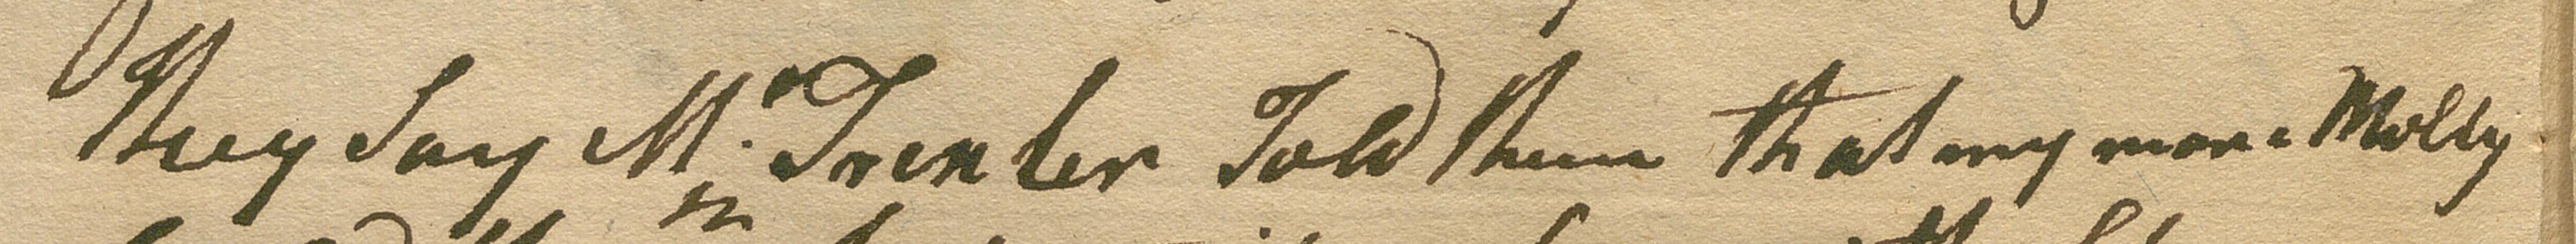they Say M^r. Trenler Told them that my mare Molly
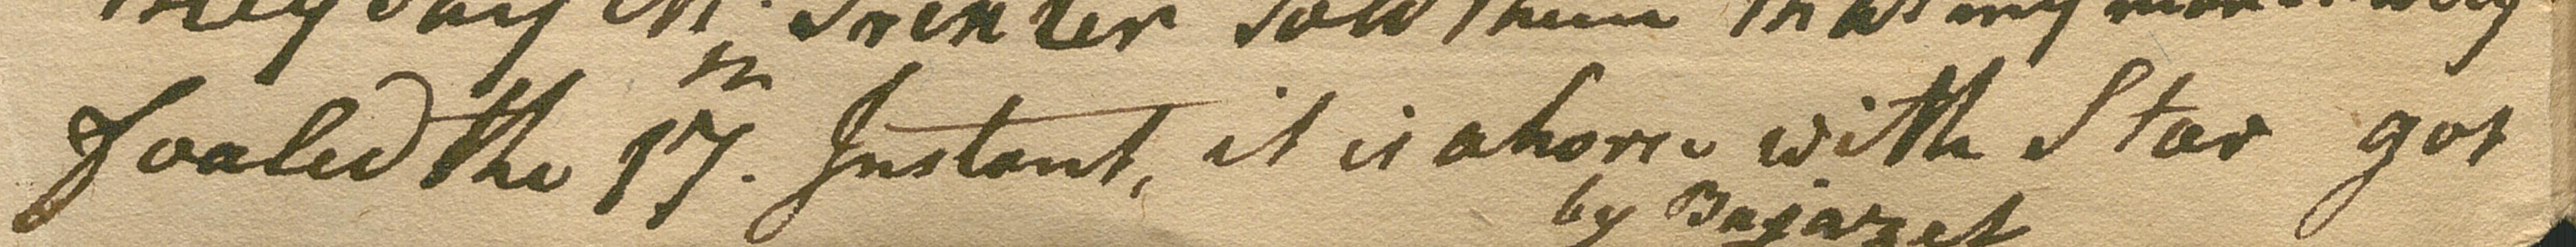foaled the 17th. Instant, it is a horse with Star got
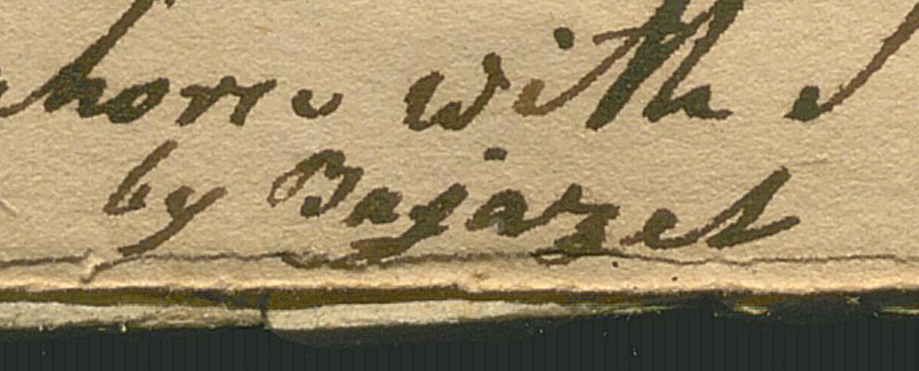by Bajaret
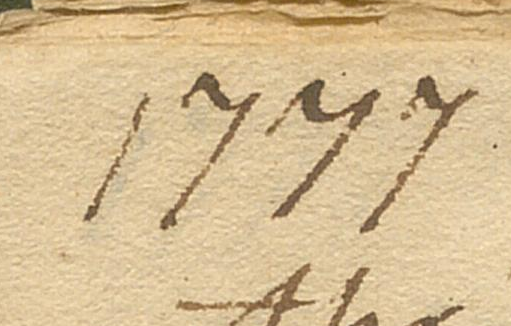1777
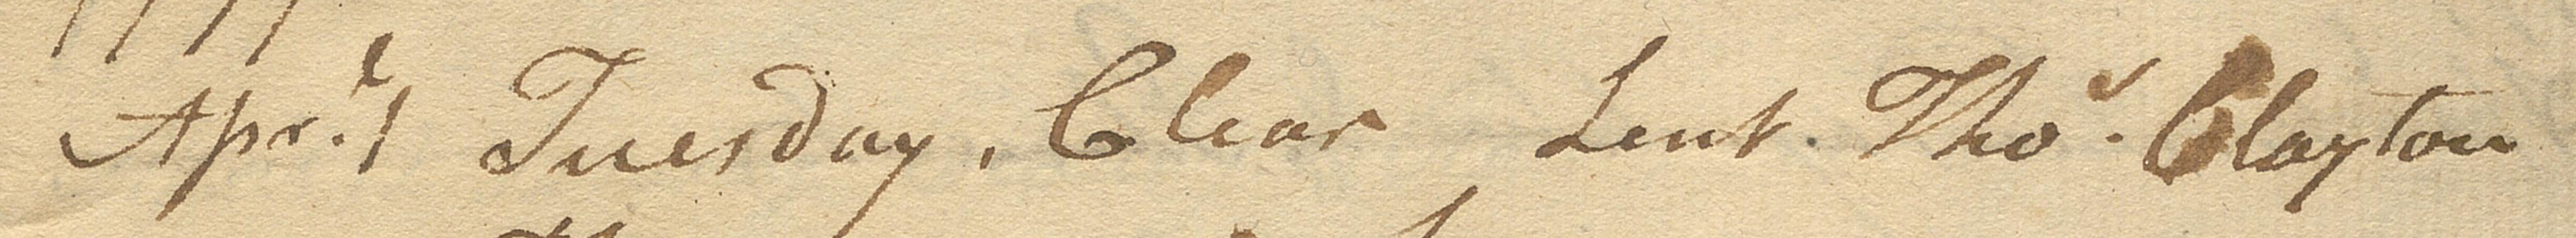Apr^l. 1 Tuesday. Clear Lent. Tho^s. Clayton
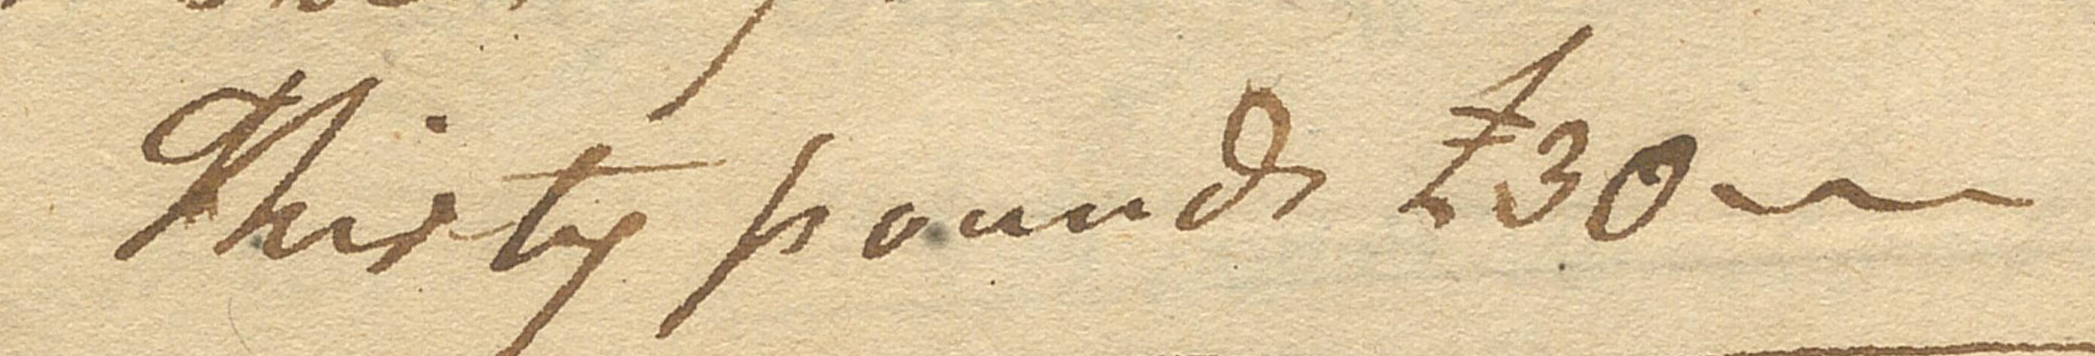Thirty pounds £30-
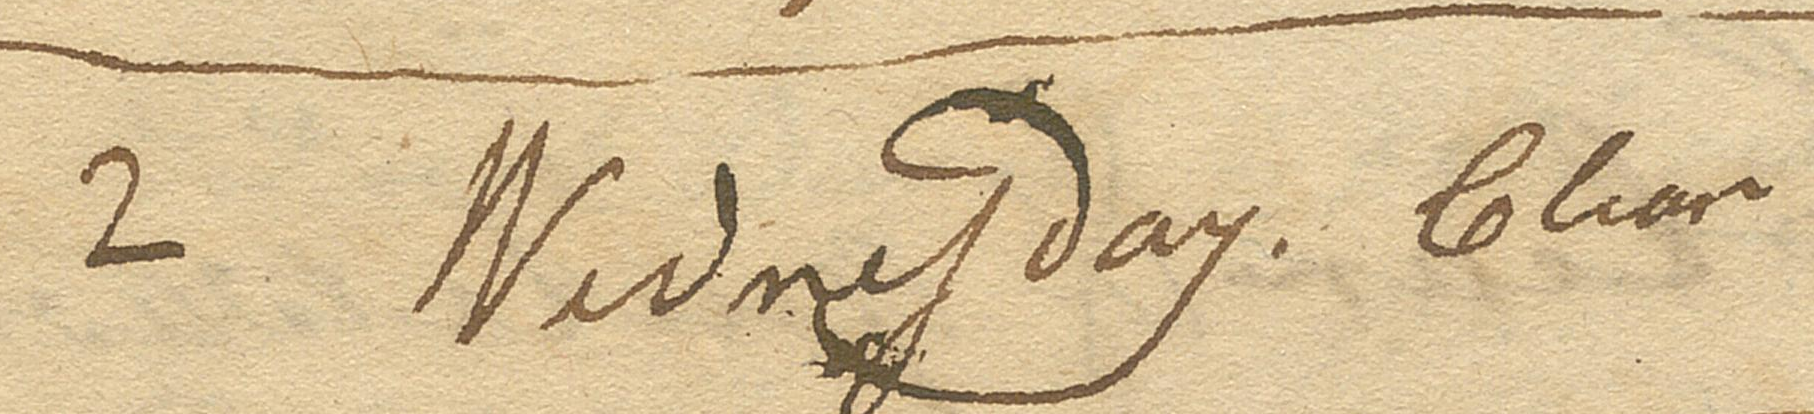2 Wednesday. Clear
